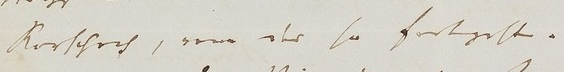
Rorschach, wenn das so fortgeht.
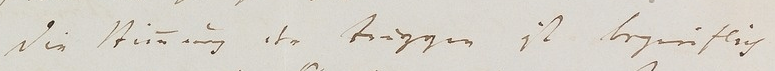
Die Stimmung der Truppen ist begreiflich
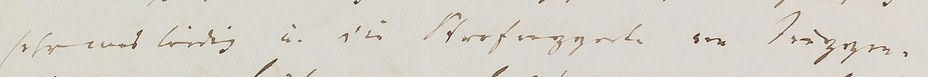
sehr mas leidig u. die Strafrapporte von Truppen-
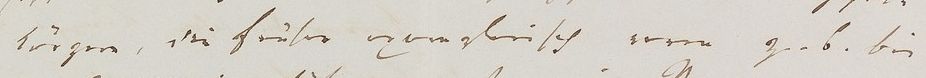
körpern, die früher exemplarisch waren z. B. bei
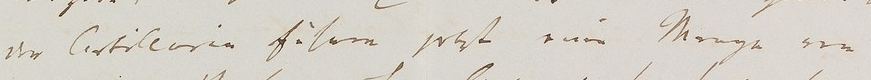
der Artillerie führen jetzt eine Menge von
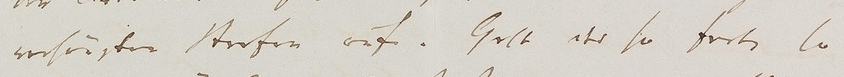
verhängten Strafen auf. Geht das so fort, so
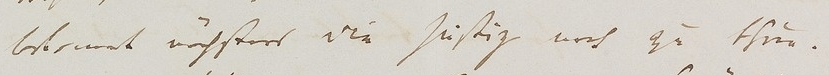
bekommt nächstens die Justiz noch zu thun.
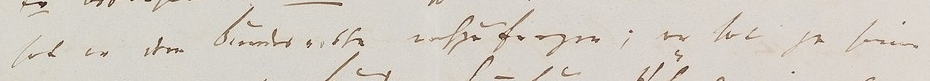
hat er dem Bundesrathe nachzufragen; er hat ja seine
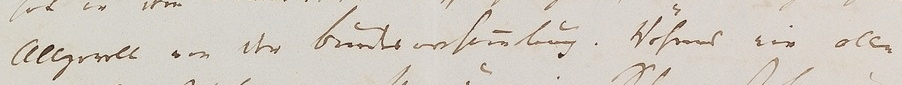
Allgewalt von der Bundesversammlung. Während wir alle
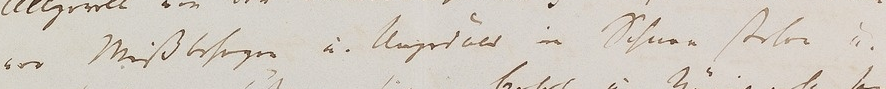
vor Mißbehagen u. Ungeduld im Schnee stehen u.
